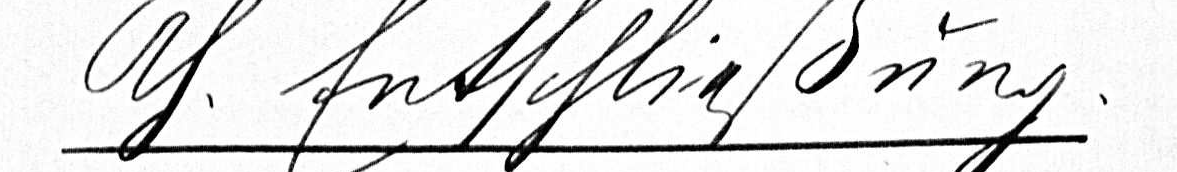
Ah Entschließung
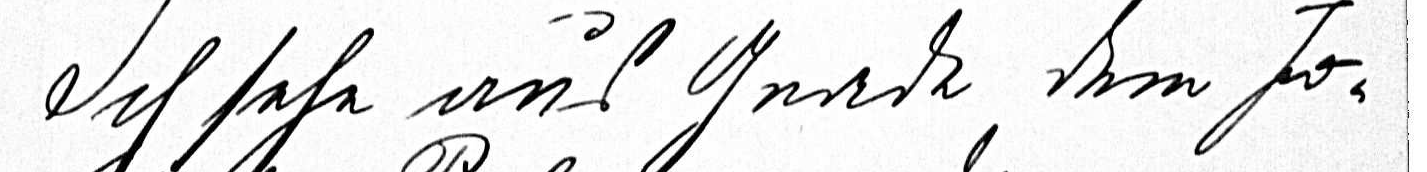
Ich sehe aus Gnade dem Jo¬
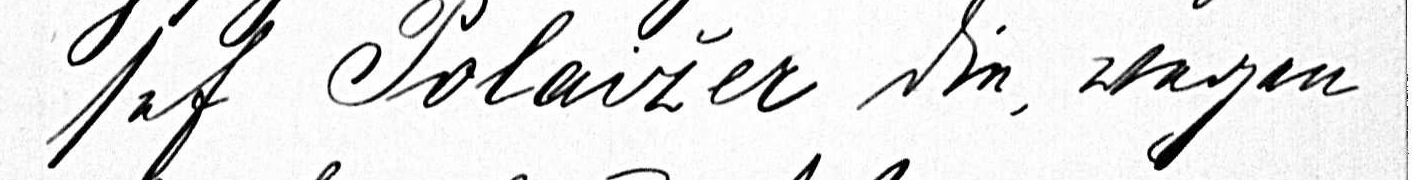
sef Polaižer die, wegen
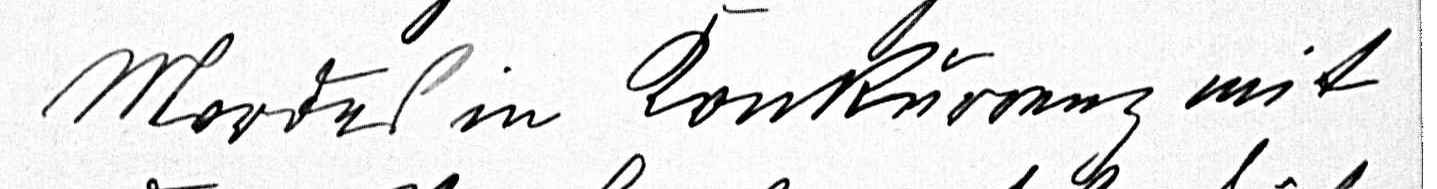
Mordes in Konkurrenz mit
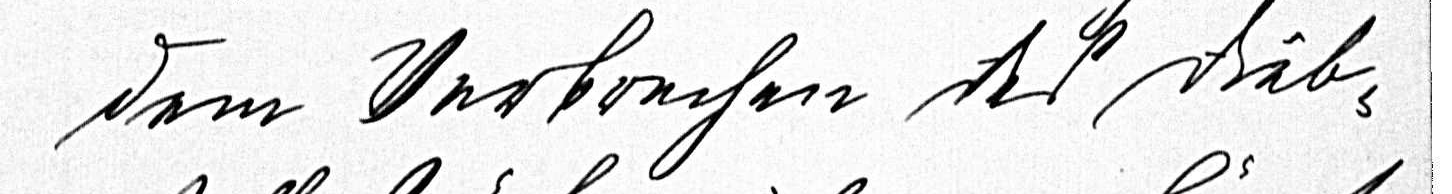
dem Verbrechen des Diebs¬
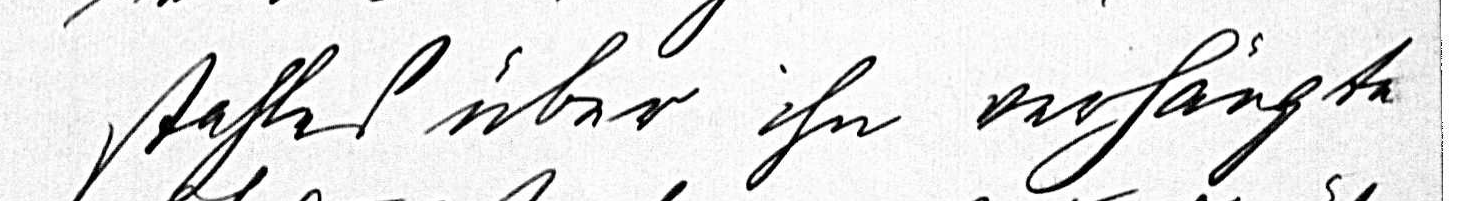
tahles über ihn verhängte
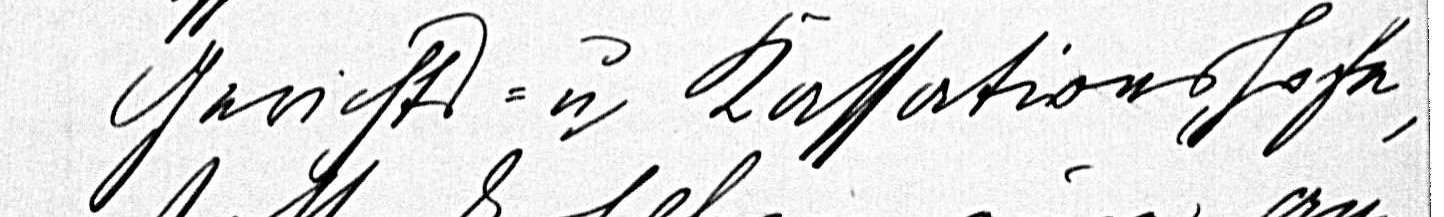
Gerichts- und Kassationshofe,
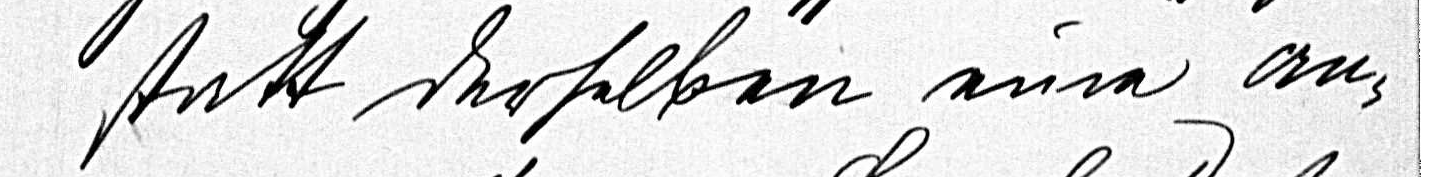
statt derselben eine an¬
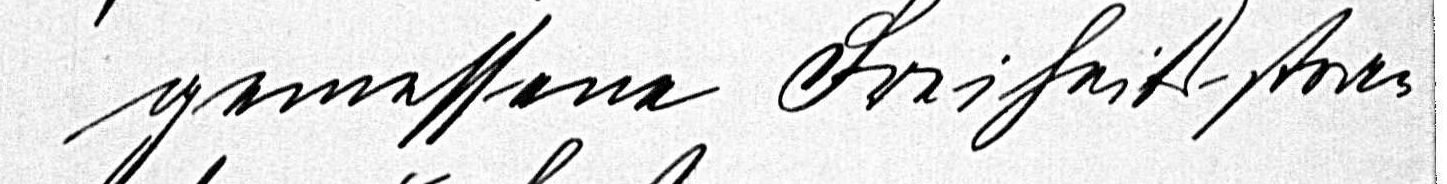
gemessene Freiheits-stra¬
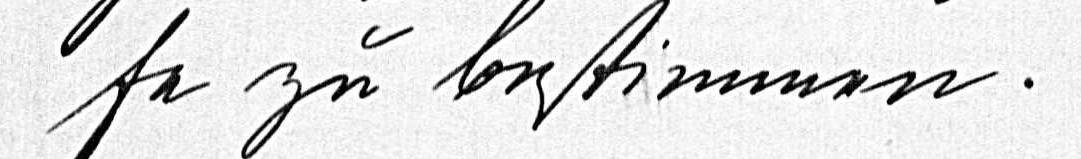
fe zu bestimmen.
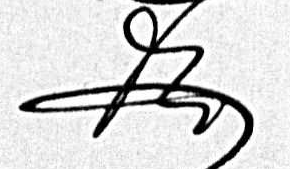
FJ
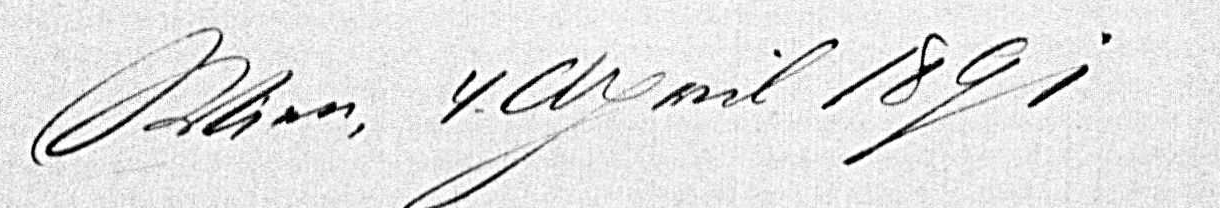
Wien, 4. April 1891
